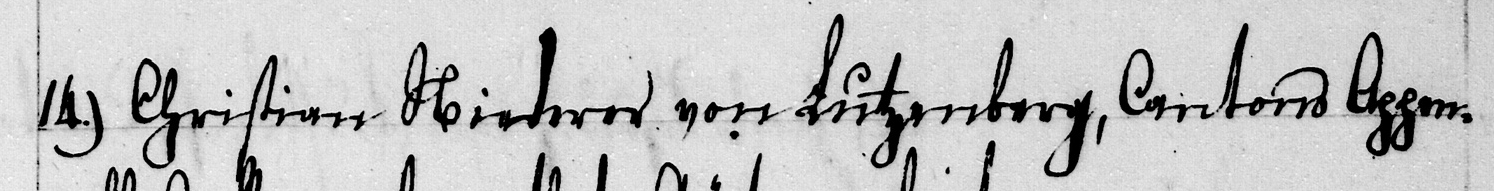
14.) Christian Niederer von Lutzenberg, Cantons Appen¬
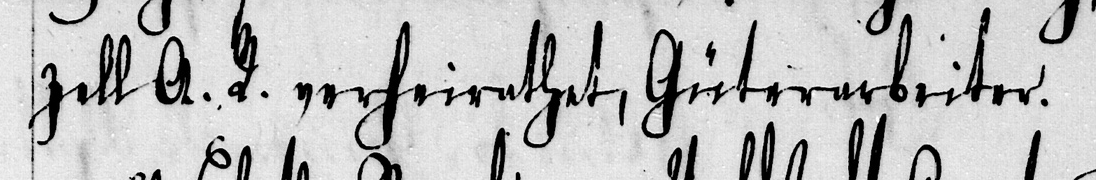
zell A.R. verheirathet, Güterarbeiter.
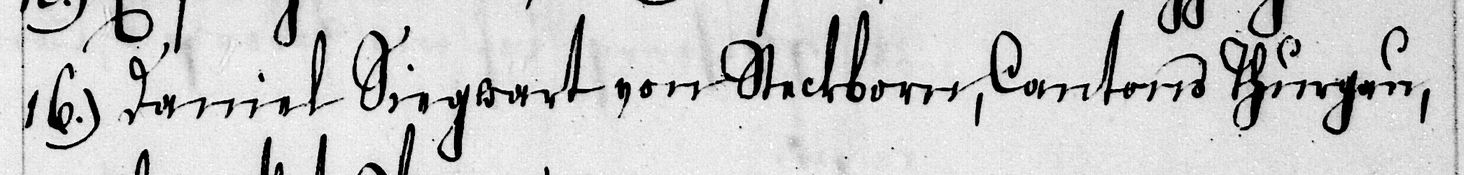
16.) Daniel Siegwart von Steckborn, Cantons Thurgau,
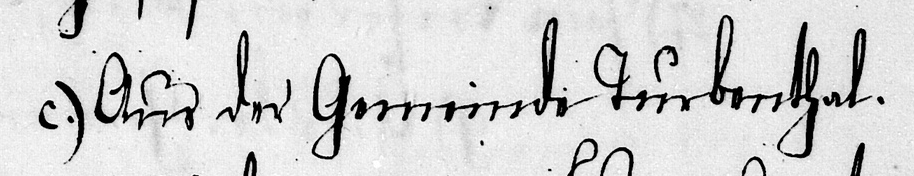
c.) Aus der Gemeinde Turbenthal.
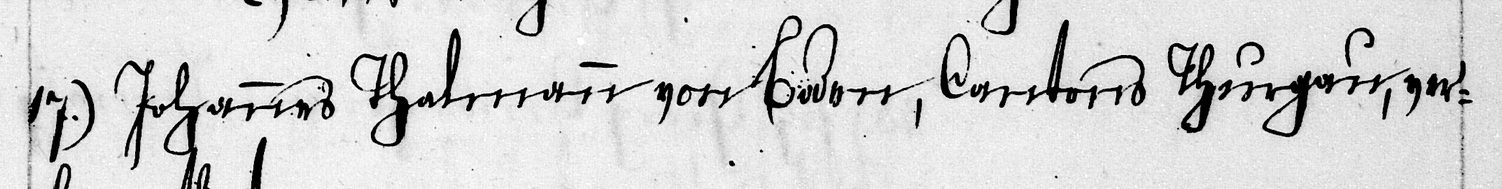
17.) Johannes Thalmann von Boden, Cantons Thurgau, ver¬
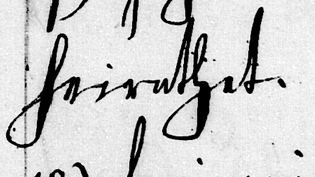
heirathet.
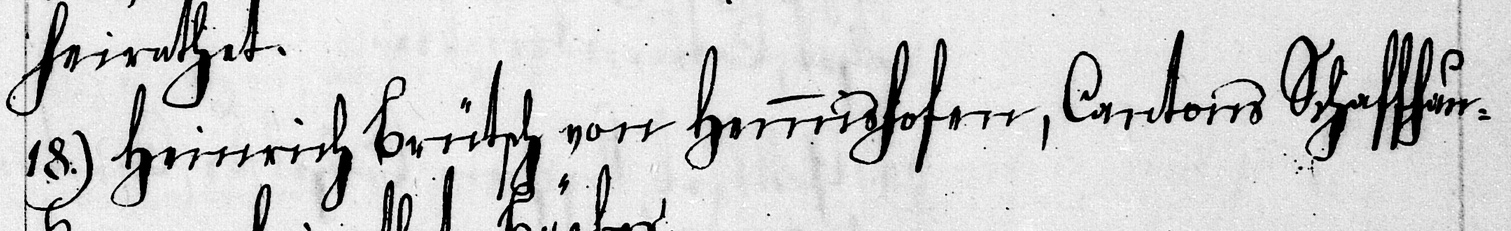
18.) Heinrich Brütsch von Hemmishofen, Cantons Schaffhau¬
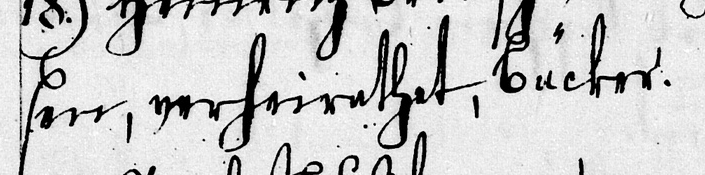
sen, verheirathet, Bäcker.
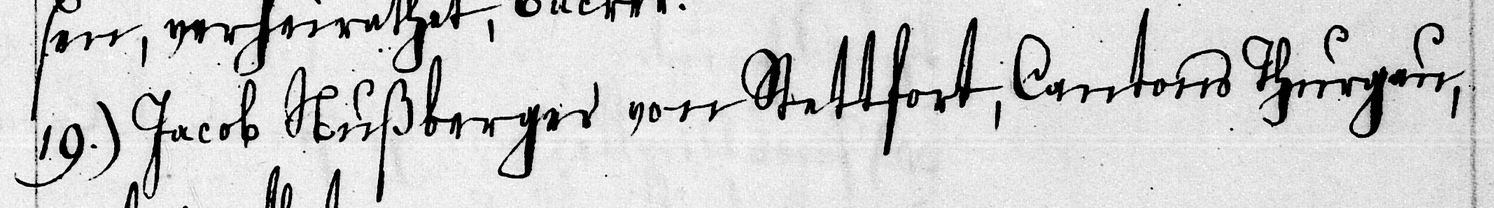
19.) Jacob Nußberger von Stettfort, Cantons Thurgau,
